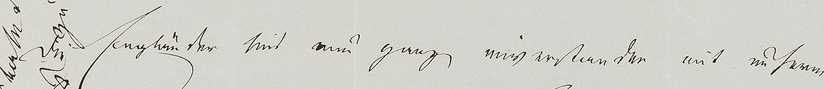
Die Engländer sind nun ganz einverstanden mit unserm
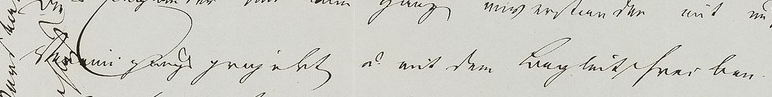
Vereinigungprojekt u. mit dem Begleitschreiben
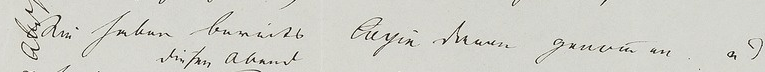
Sie haben bereits Copie davon genommen u
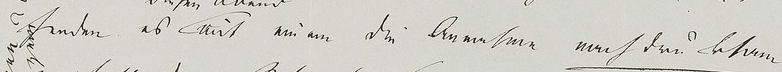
diesen Abend mit einem die Annahme nachdrucksam
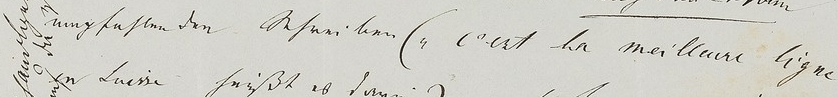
empfehlenden Schreiben («c'est la meilleure ligne
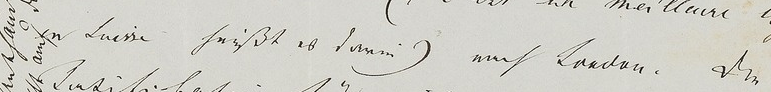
en Suisse» heißt es darin) nach London. Die
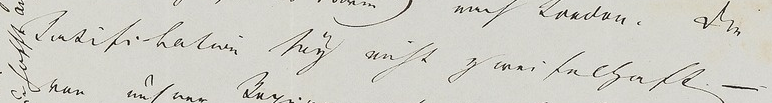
Ratifikation sey nicht zweifelhaft.
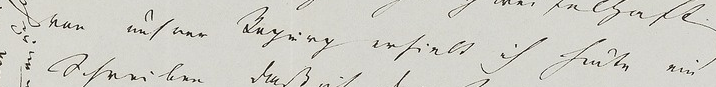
Von unsrer Regierg erhielt ich heute ein
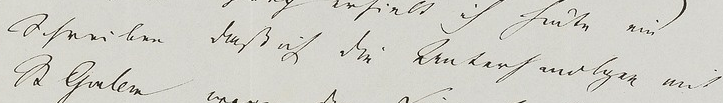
Schreiben daß ich die Unterhandlgen mit
